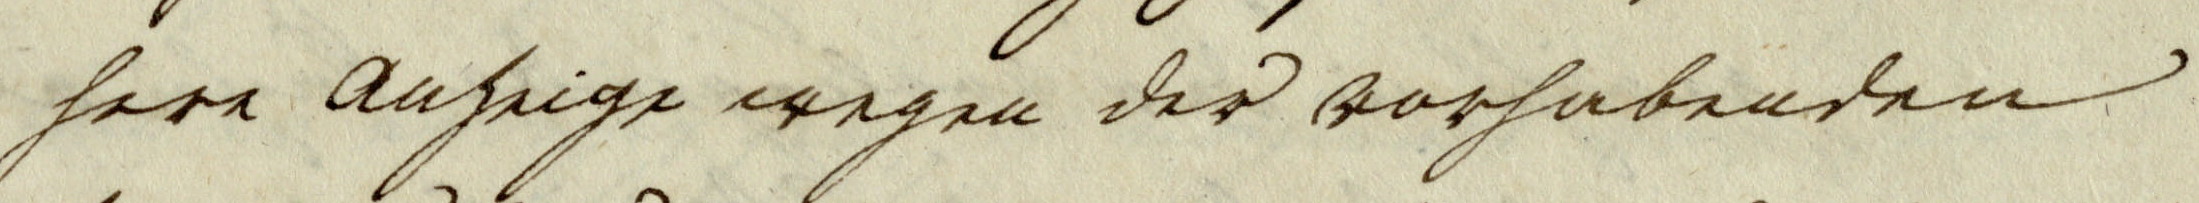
here Anzeige wegen der vorhabenden
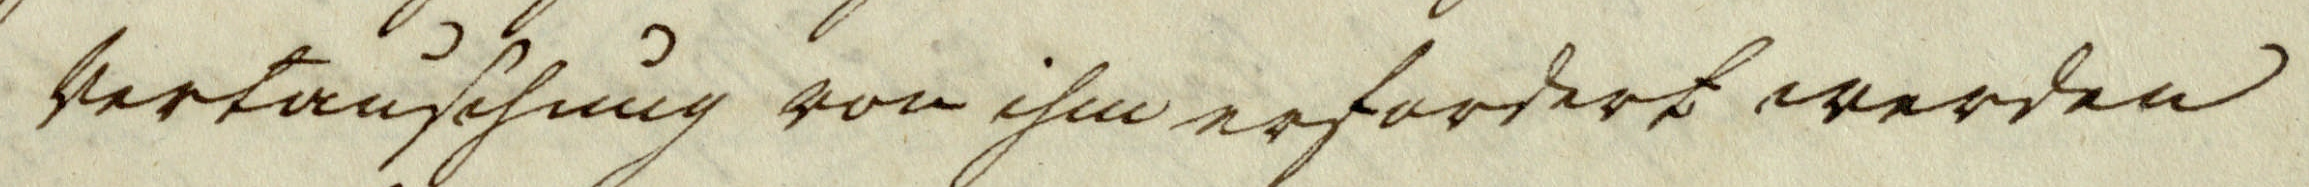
Vertauschung von ihm erfordert werden
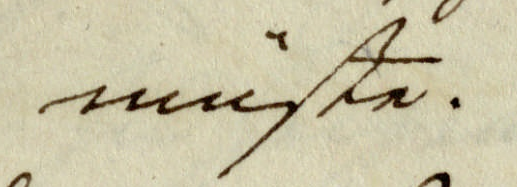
müsste.
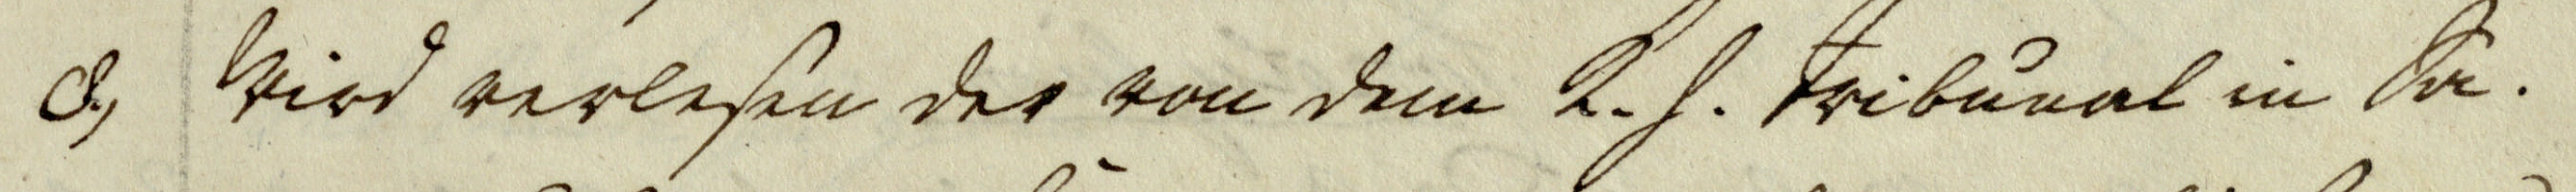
8., Wird verlesen der von dem K. H. Tribunal in Sa¬
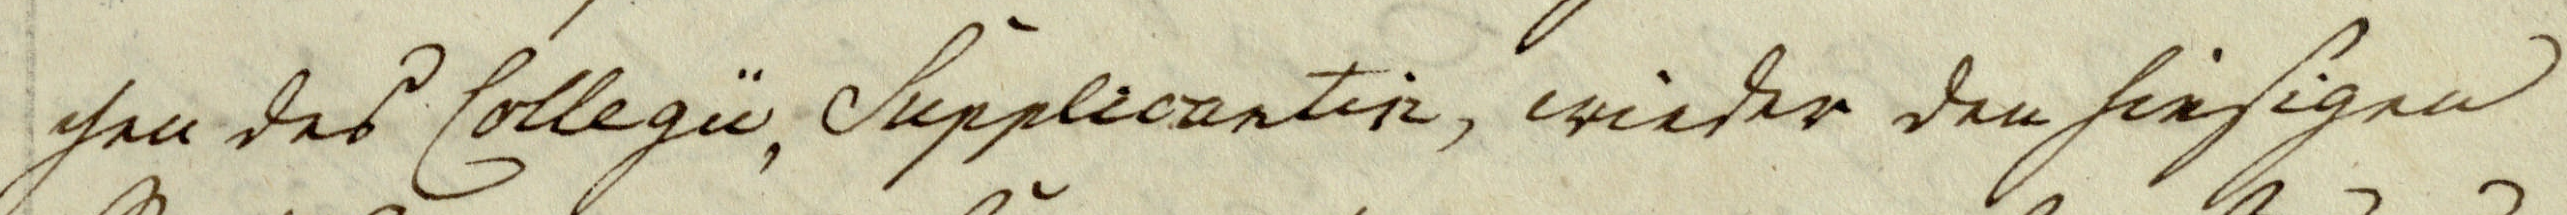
chen des Collegii, Supplicantin, wieder den hiesigen
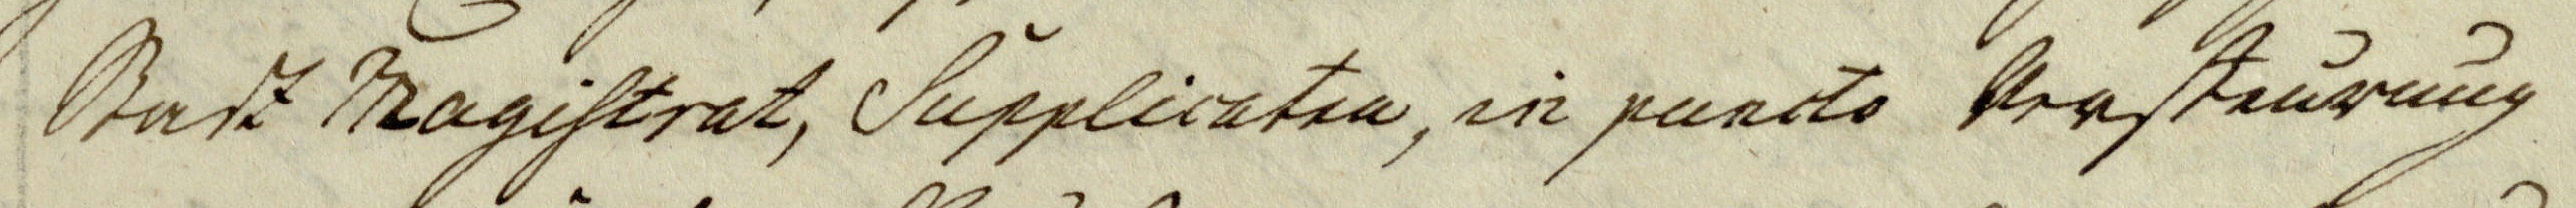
Stadt Magistrat, Supplicaten, in puncto Versteurung
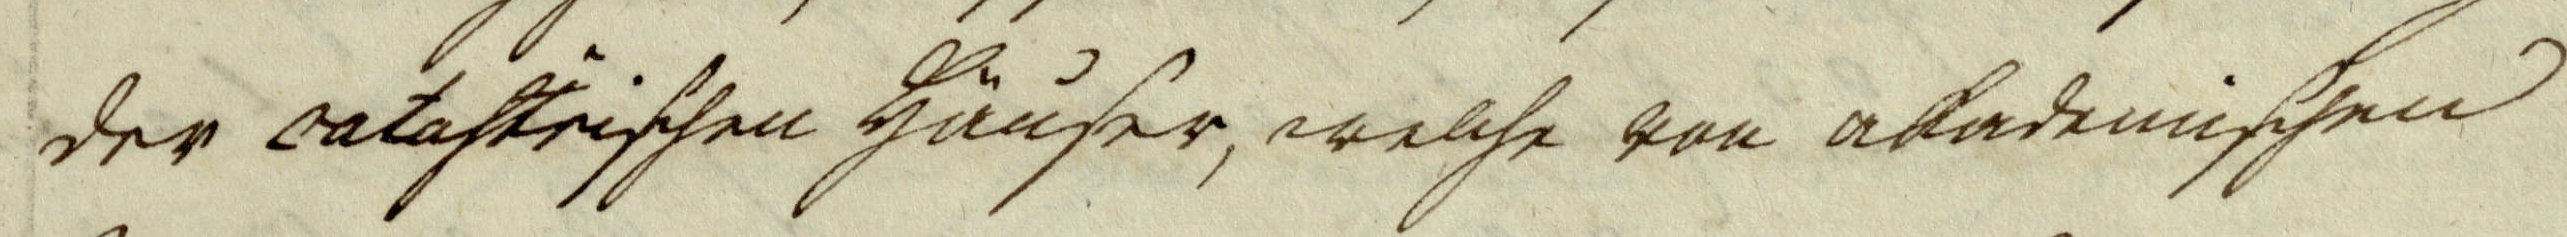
der catastrischen Häuser, welche von akademischen
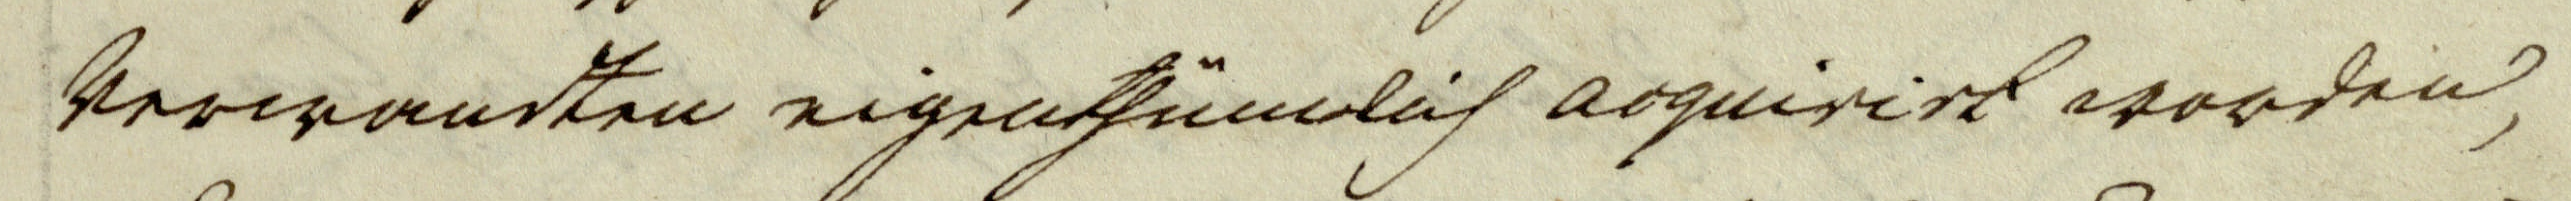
Verwandten eigenthümlich acquirirt worden,
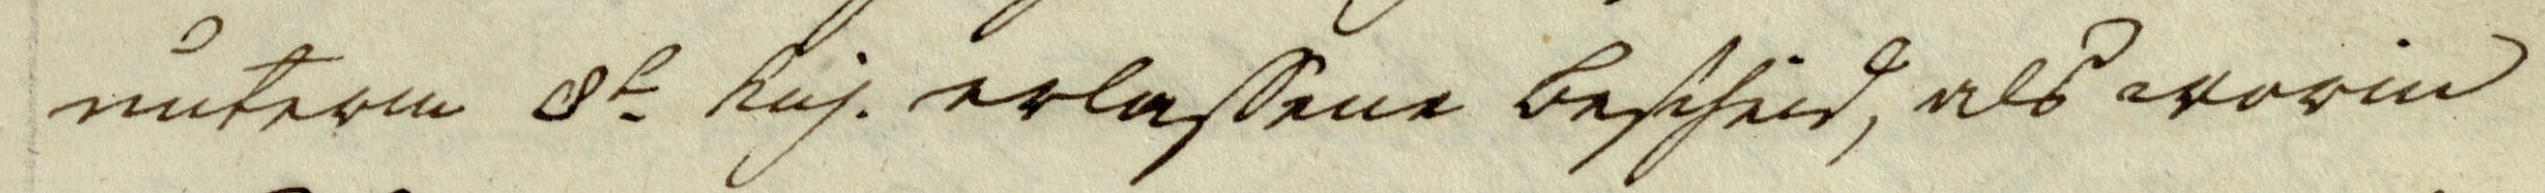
unterm 8t. huj. erlassene Bescheid, als worin
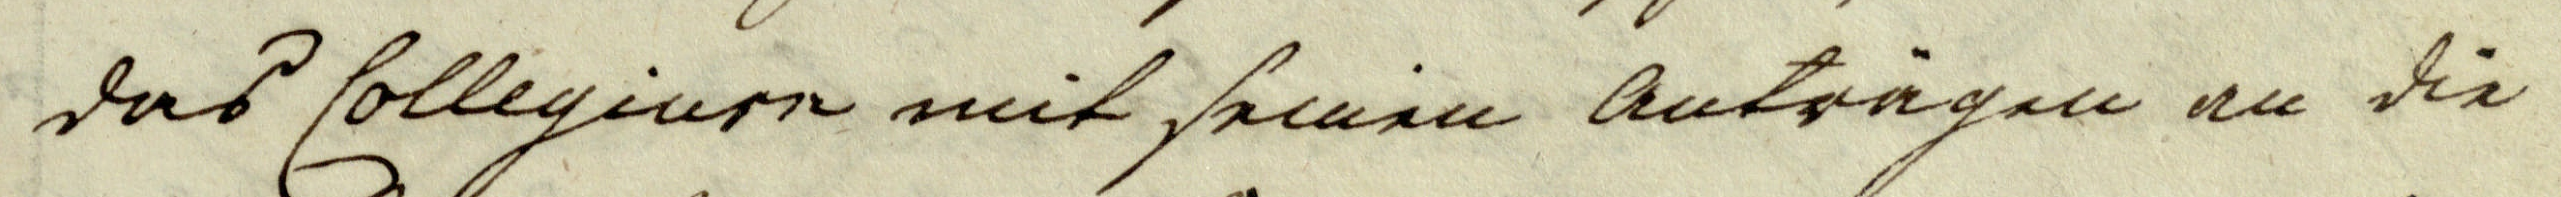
das Collegium mit seinen Anträgen an die
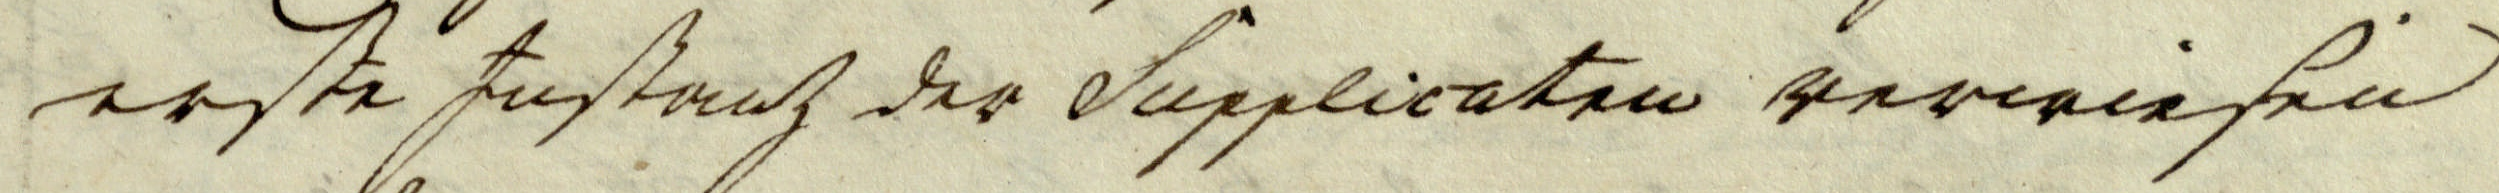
erste Instanz der Supplicaten verwiesen
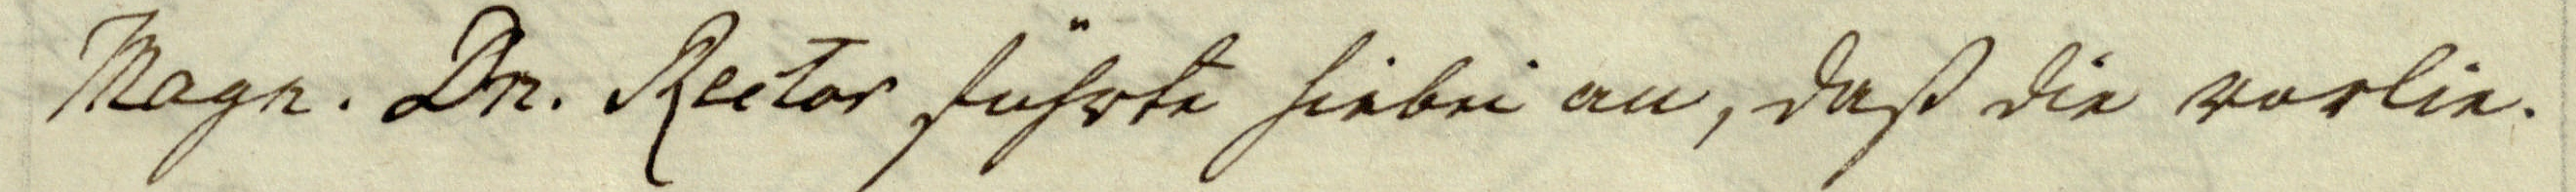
Magn. Dn. Rector führte hiebei an, daß die vorlie¬
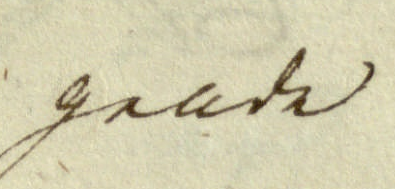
gende
